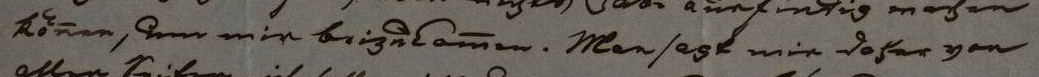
können, um mir beizukommen. Man sagt mir daher von
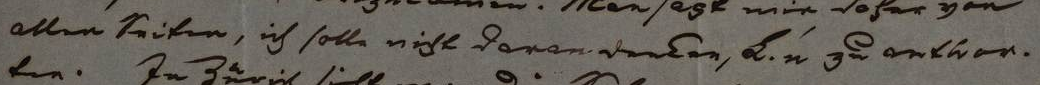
allen Seiten, ich solle nicht daran denken, L.'n zu antwor-
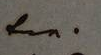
ten.
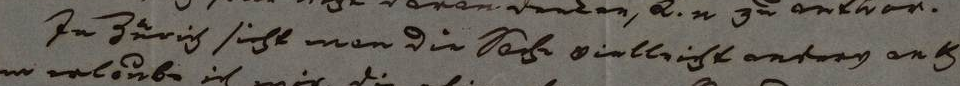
In Zürich sieht man die Sache vielleicht anders an &
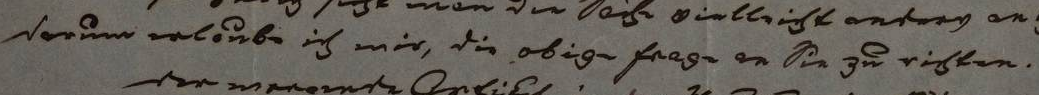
darum erlaube ich mir, die obige Frage an Sie zu richten.
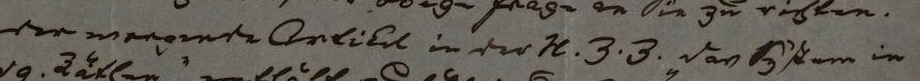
Der morgende Artikel in der N.Z.Z. «Das System in
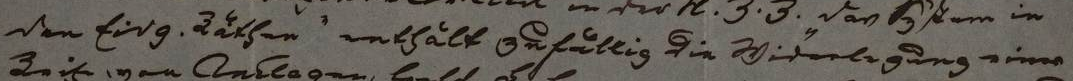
den Eidg. Räthen» enthält zufällig die Widerlegung einer
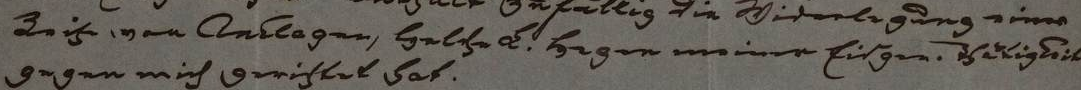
Reihe von Anklagen, welche L. wegen meiner Eidgen. Thätigkeit
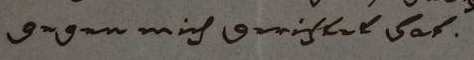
gegen mich gerichtet hat.
